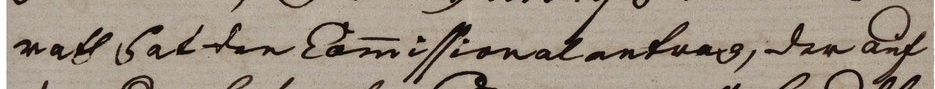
rath hat den Commissionalantrag, der auf
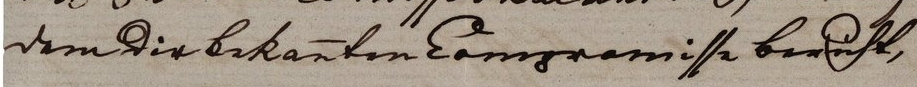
dem Dir bekannten Compromisse beruht,
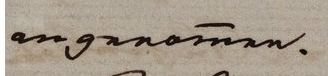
angenommen.
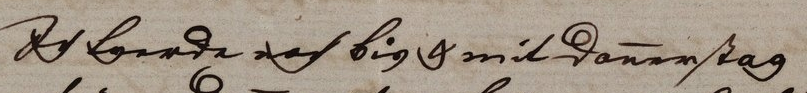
Ich werde noch bis & mit Donnerstag
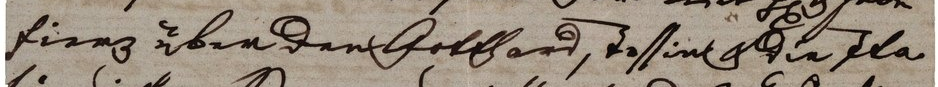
Fierz über den Gotthard, Tessin & die Ita-
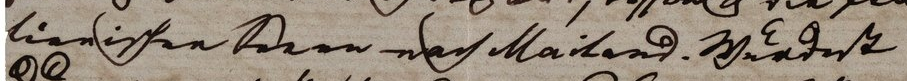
lienischen Seeen nach Mailand. Würdest
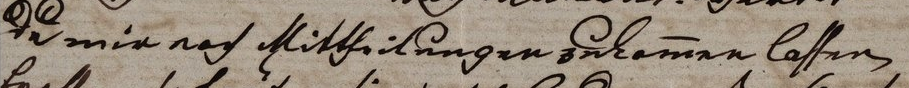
du mir noch Mittheilungen zukommen lassen
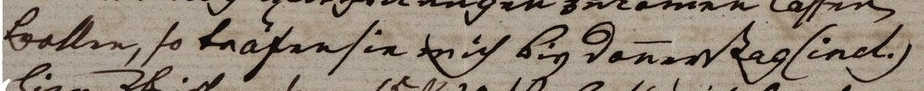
wollen, so träfen sie mich bis Donnerstag (incl. )
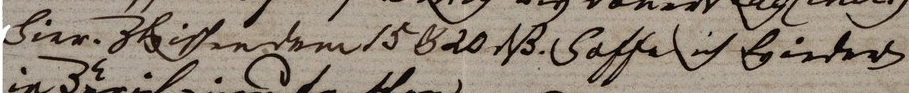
hier. Zwischen dem 15. & 20. dß hoffe ich wieder
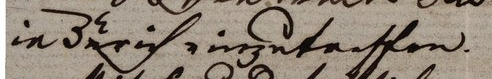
in Zürich einzutreffen.
